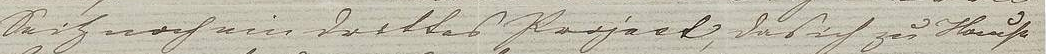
Seitz noch ein drittes Project, das ich zu Hause
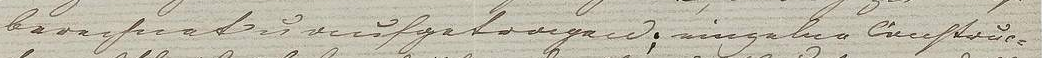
berechnet u aufgetragen; einzelne Construc-
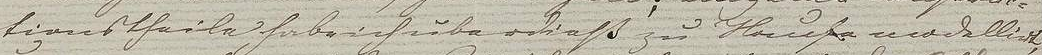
tionstheile habe ich überdieß zu Hause modellirt,
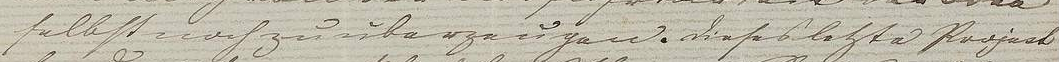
selbst noch zu überzeugen. Dieses letzte Project
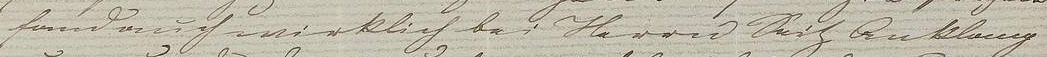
fand auch wirklich bei Herrn Seitz Anklang
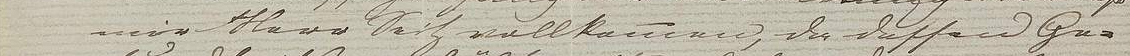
mir Herr Seitz vollkommen, da dessen Ge-
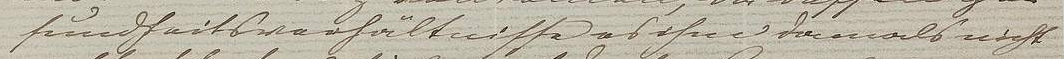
sundheitsverhältnisse es ihm damals nicht
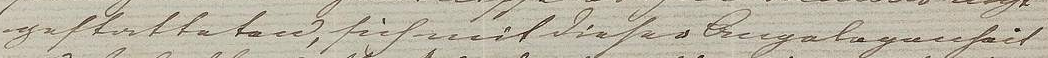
gestatteten, sich mit dieser Angelegenheit
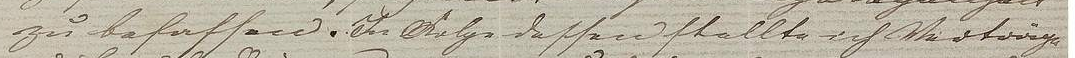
zu befassen. In Folge dessen stellte ich Verträge
